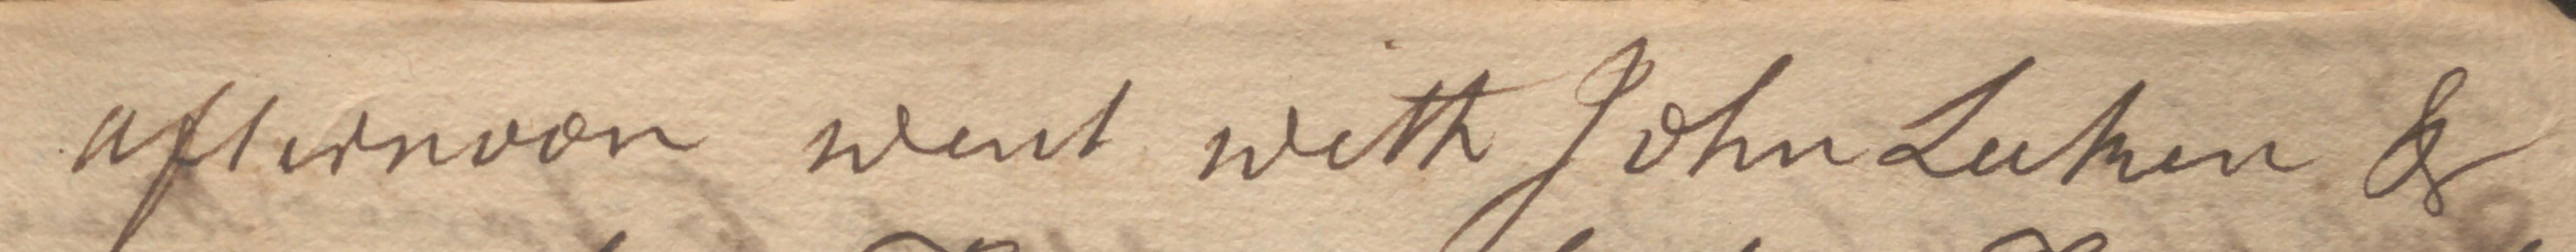afternoon went with John Luken &
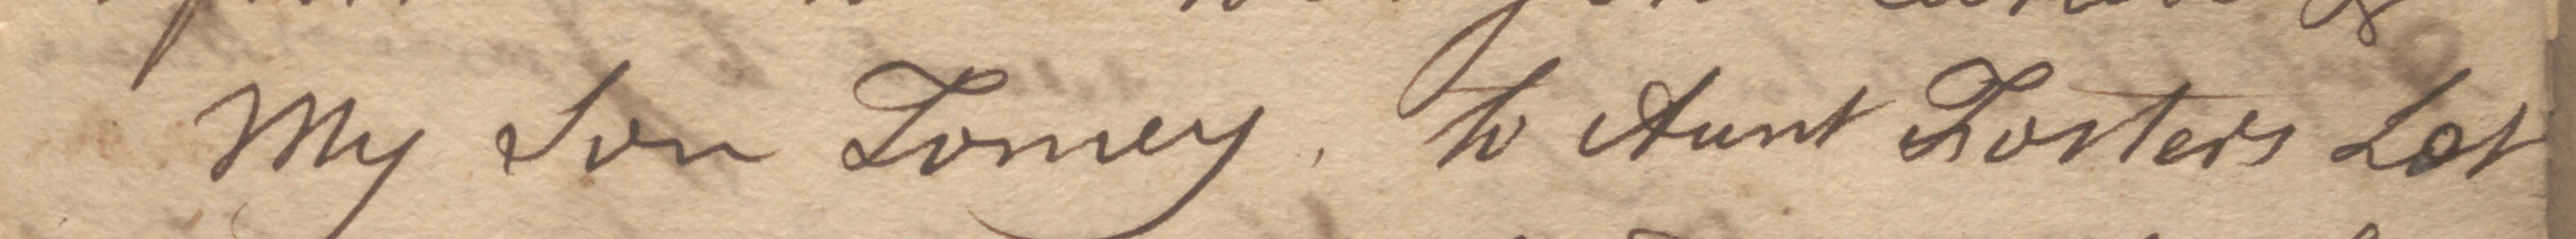My Son Tomey to Aunt Fosters Lot
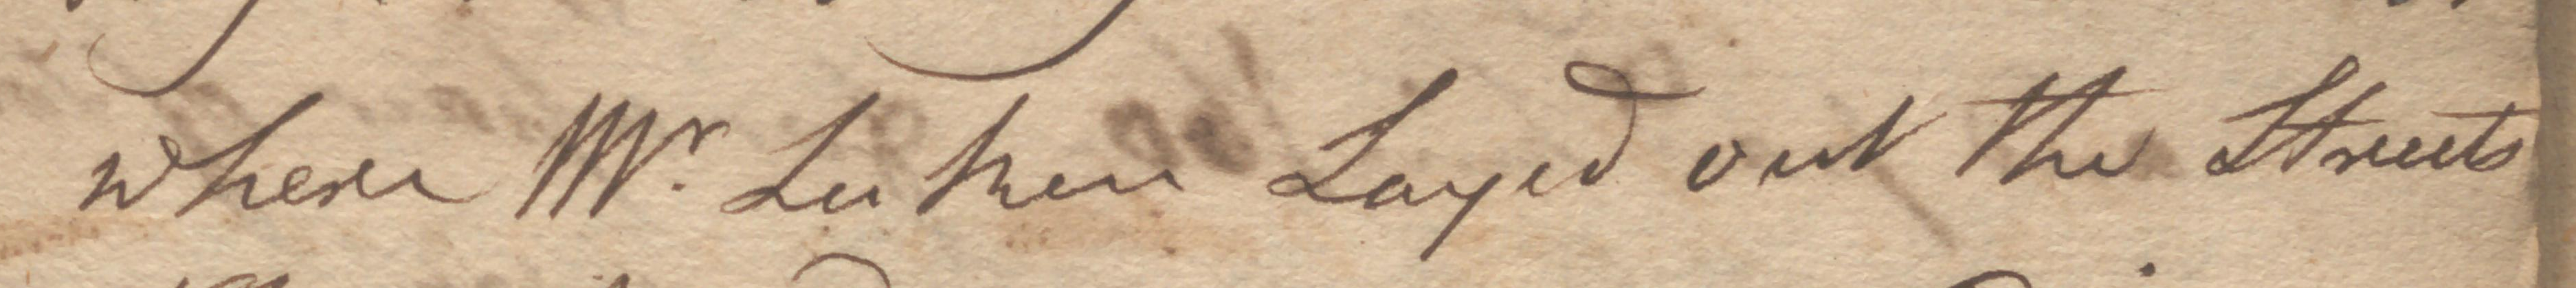where M^r. Luken Layed out the Streets
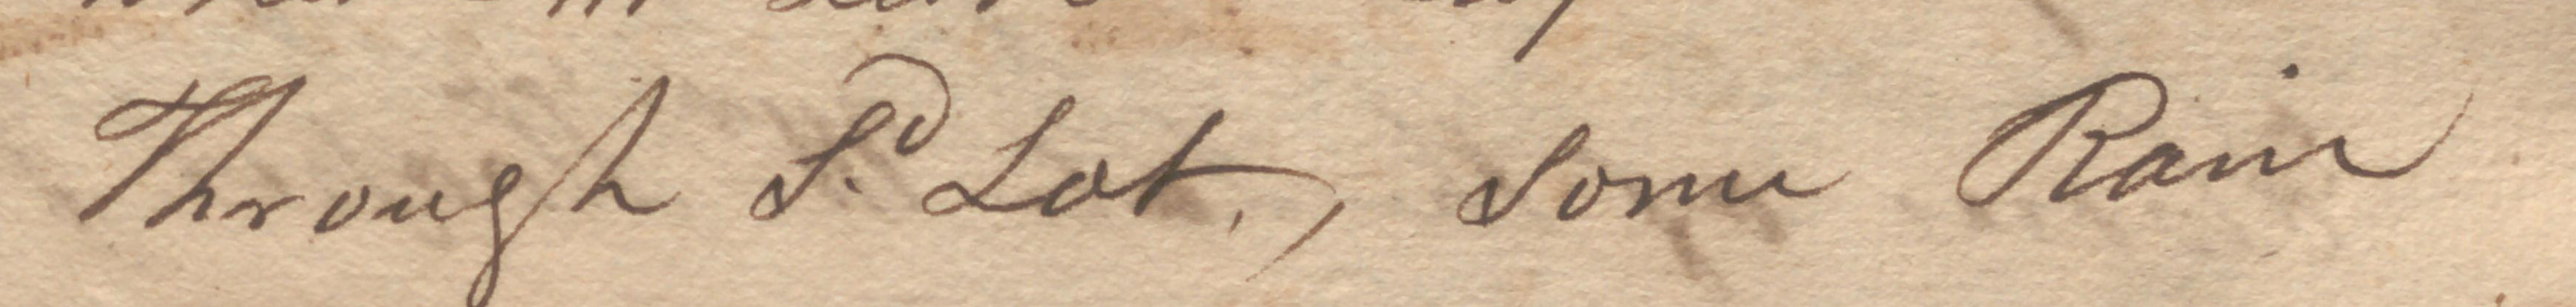Through s^d. Lot., some Rain
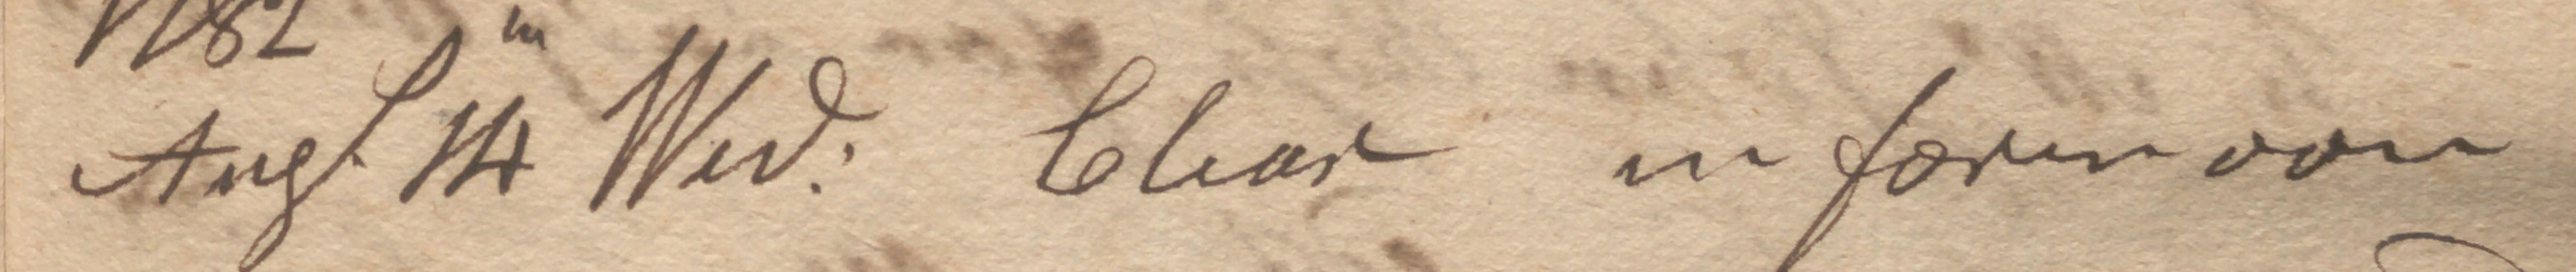Ang^t. 14 Wed: Clear in forenoon
